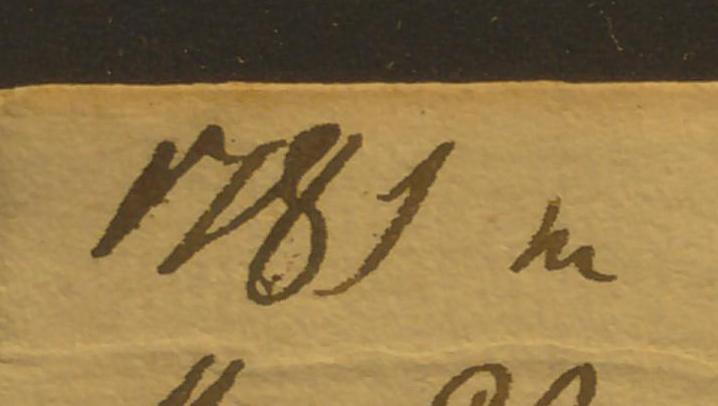1781
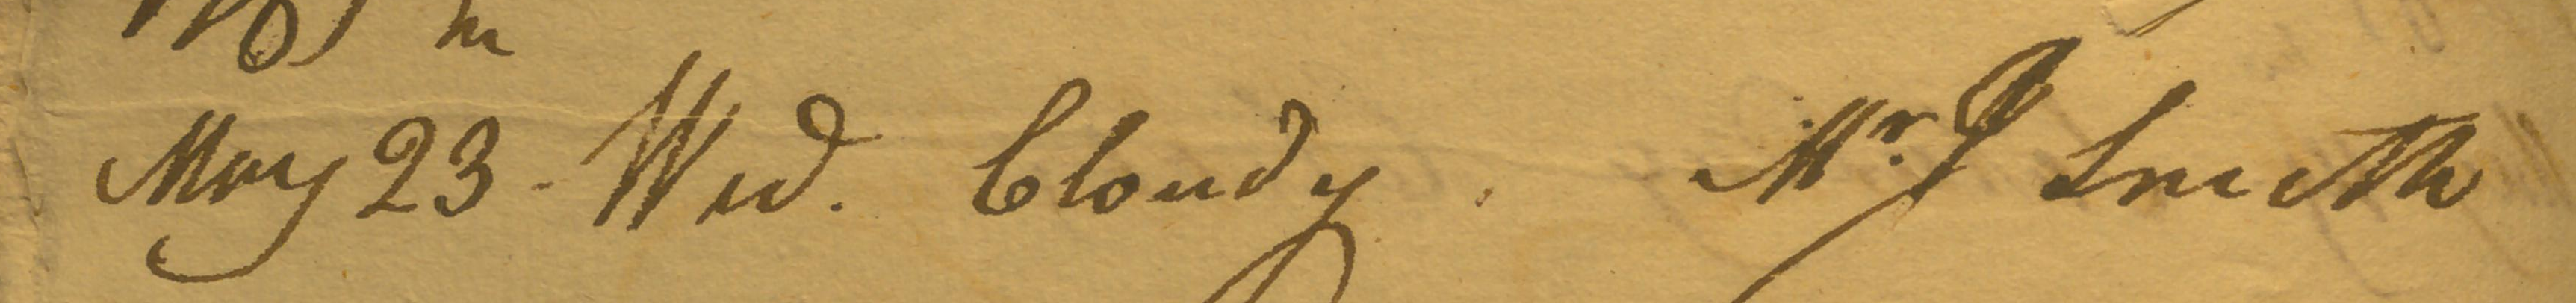May 23^th. Wed. Cloudy. M^r. J Smith
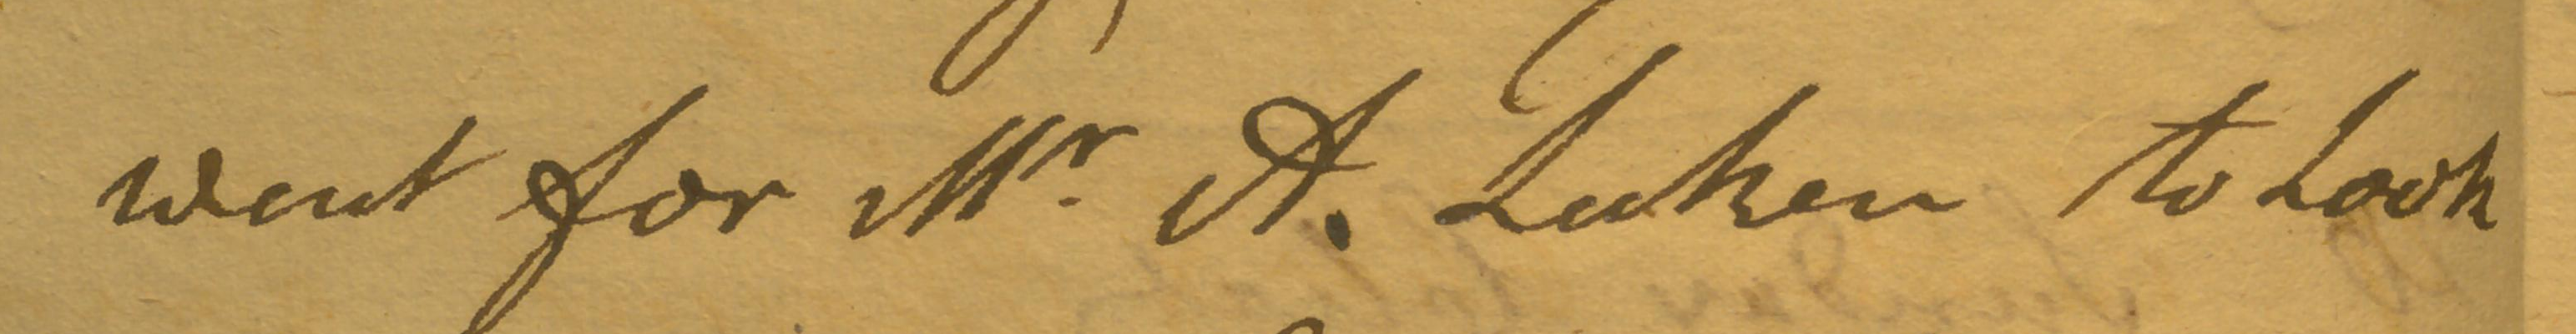went for M^r. A. Luken to Look
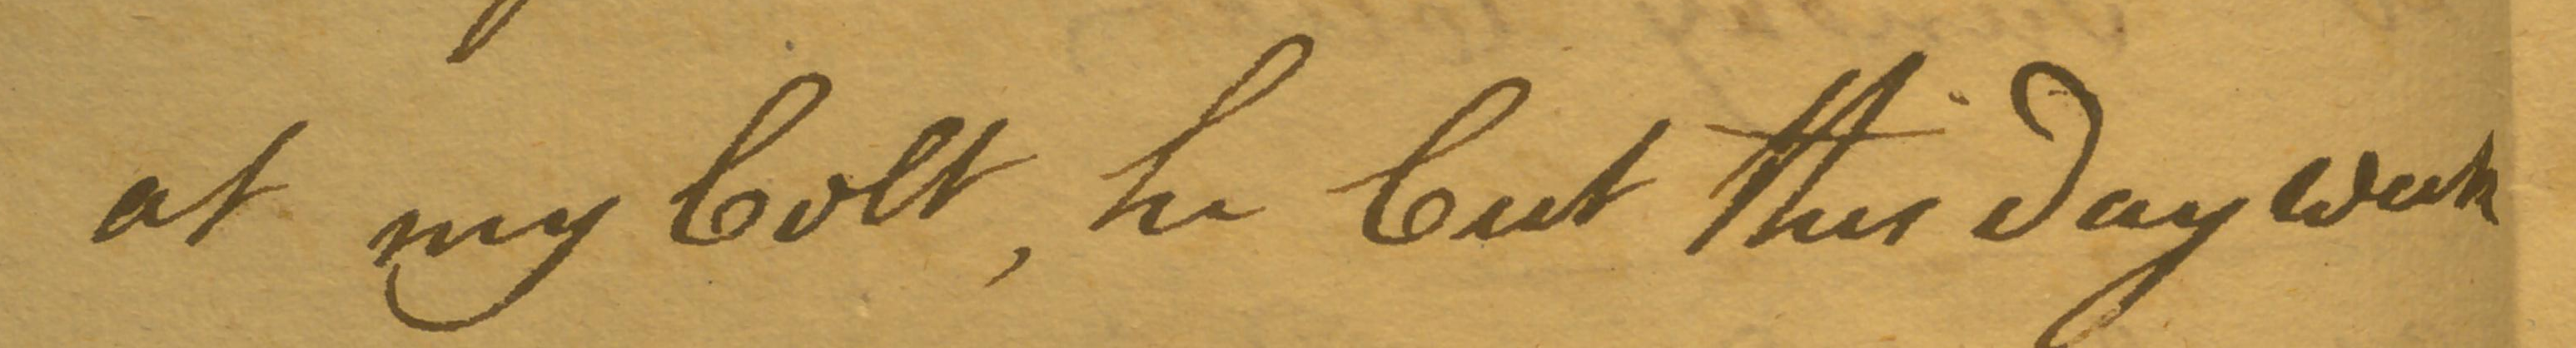at my Colt, he Cut this day week
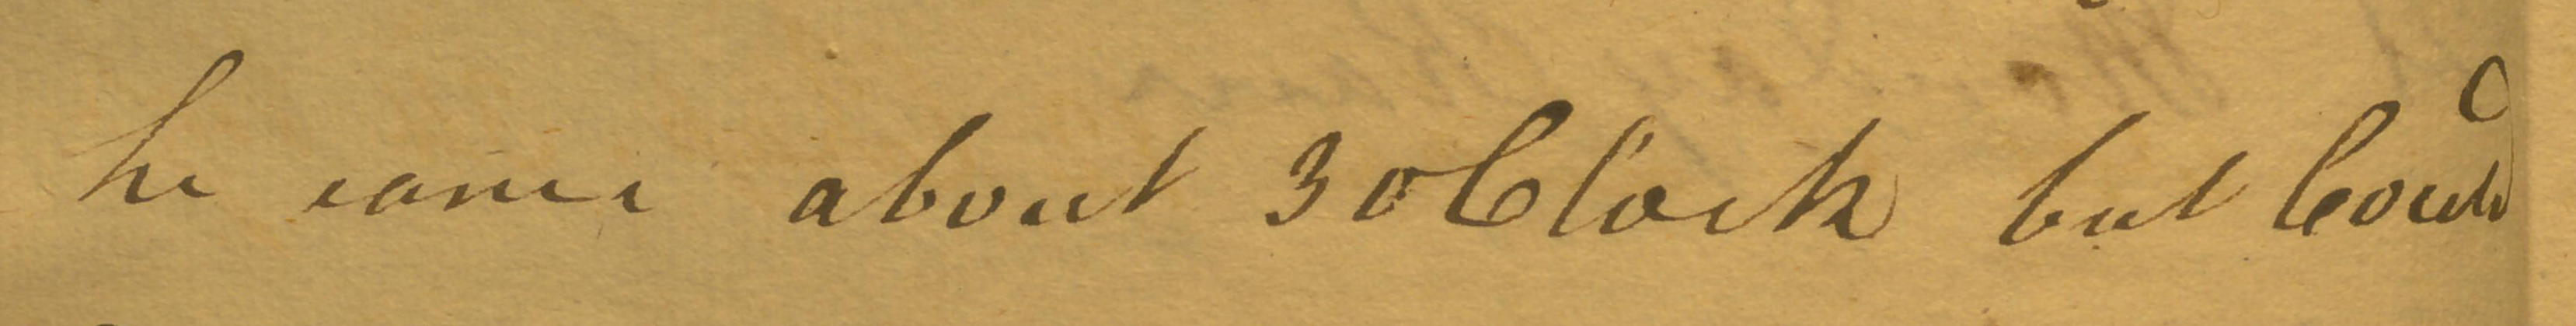he came about 3 oClock but Could
